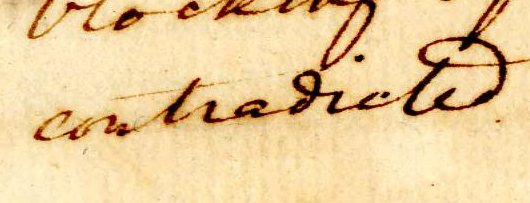contradicted.
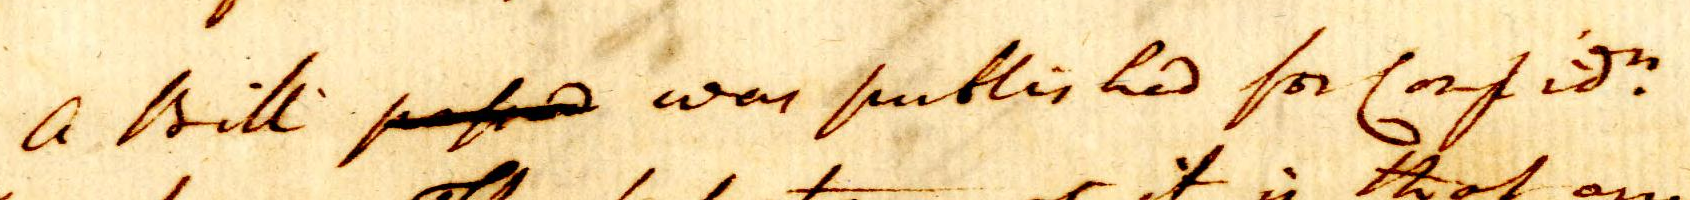A Bill passed was published for Confed^n.
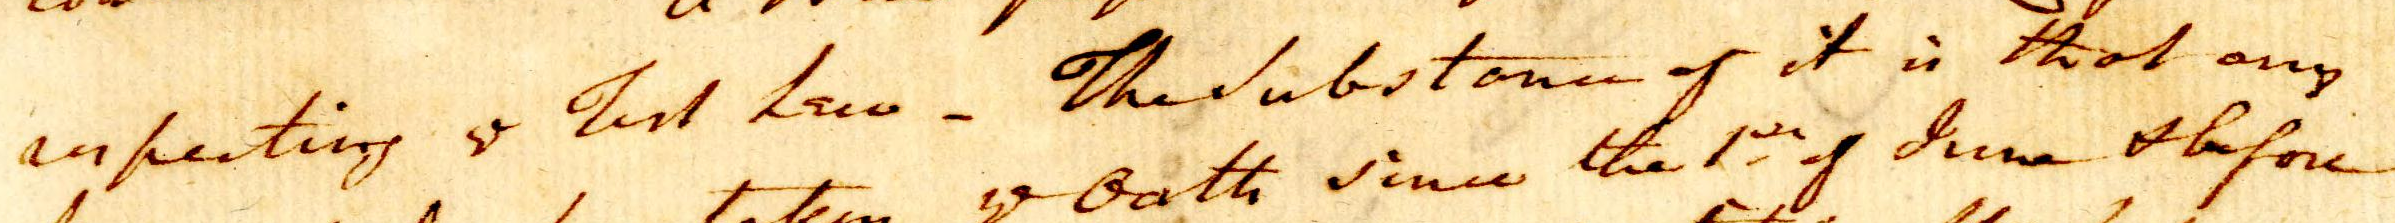expecting y^e Test Law. The Substance of it is that any
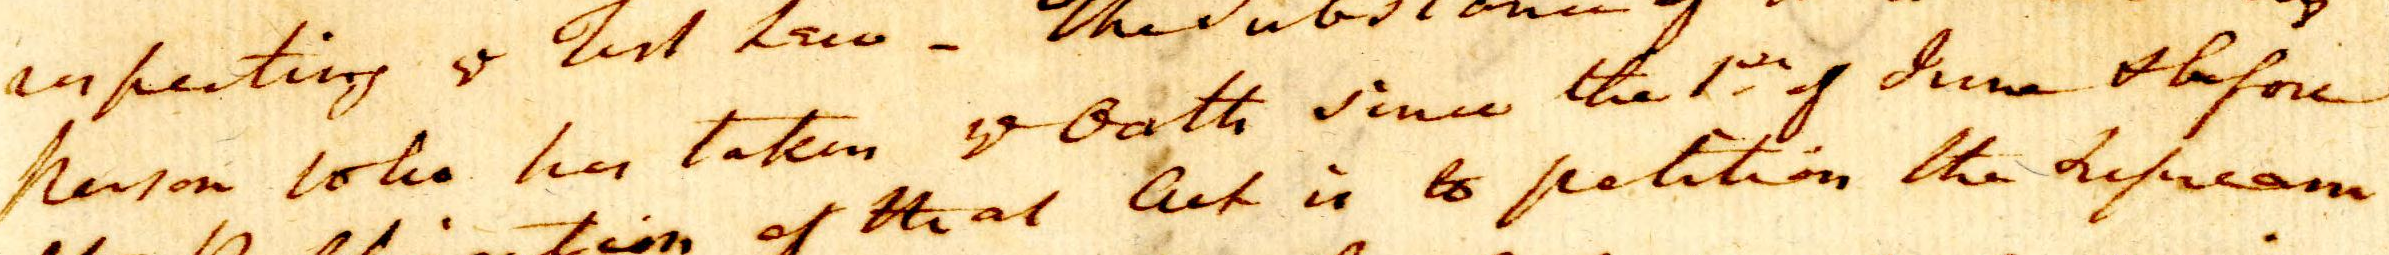Person who has taken y^e Oath since the 1^st of June & before
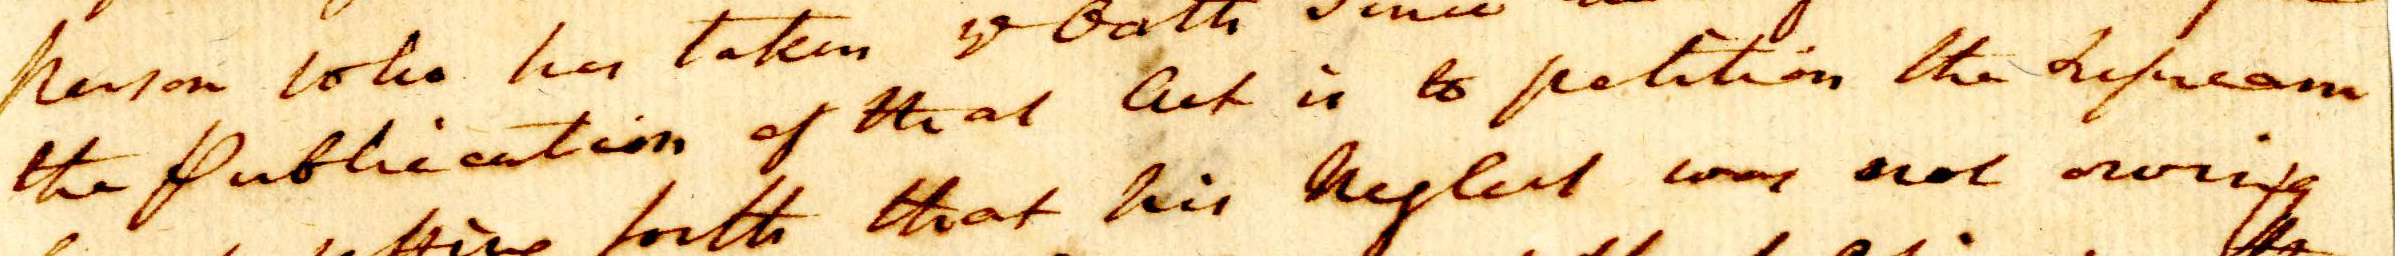the Publication of that Act is to petition the Supream
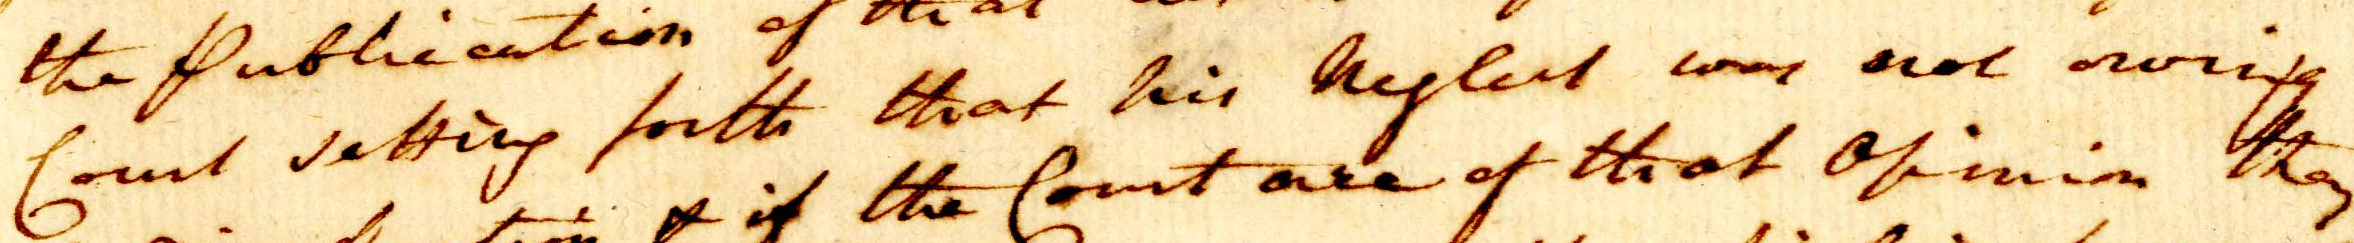Court setting forth that his Neglect was not owing
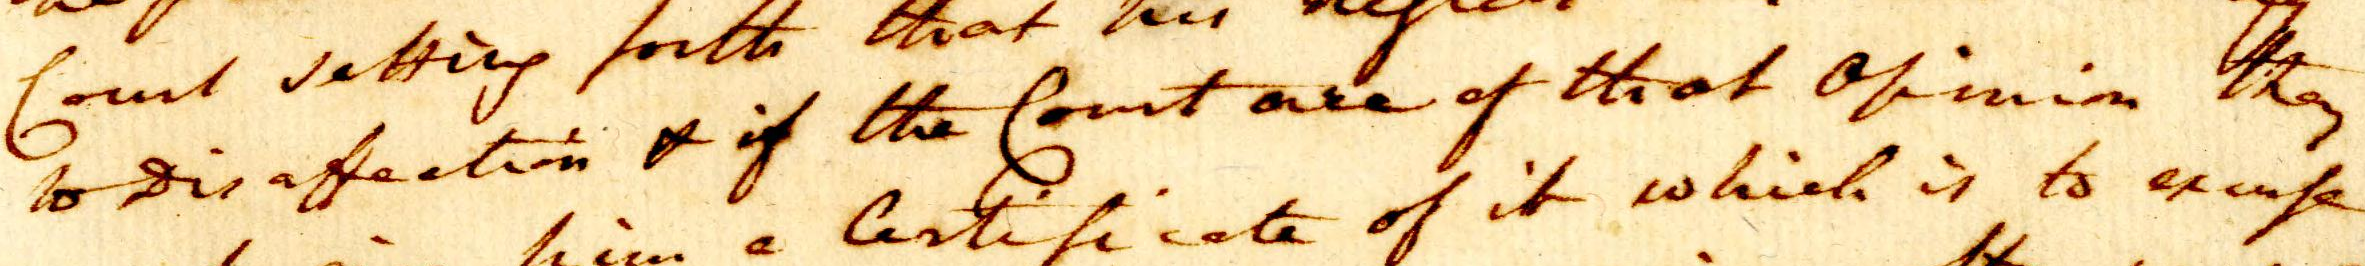to Disaffection &if the Court are of that Opinion they
